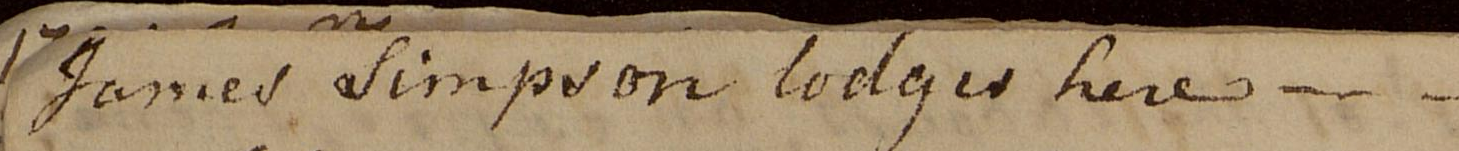James Simpson lodges here-
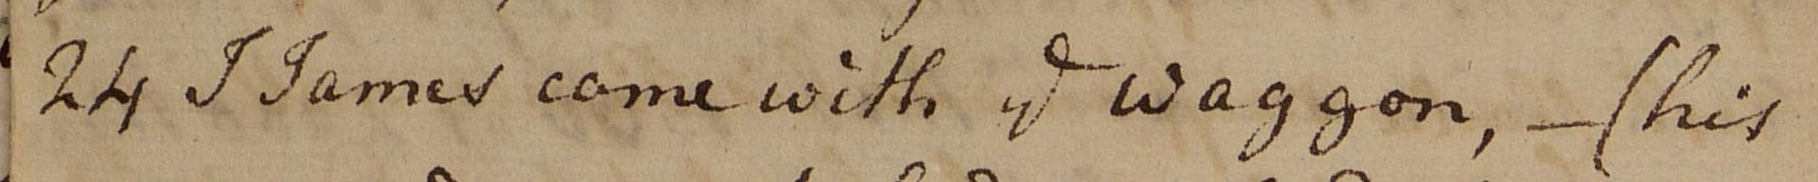24 J James came with y^e waggon,- (his
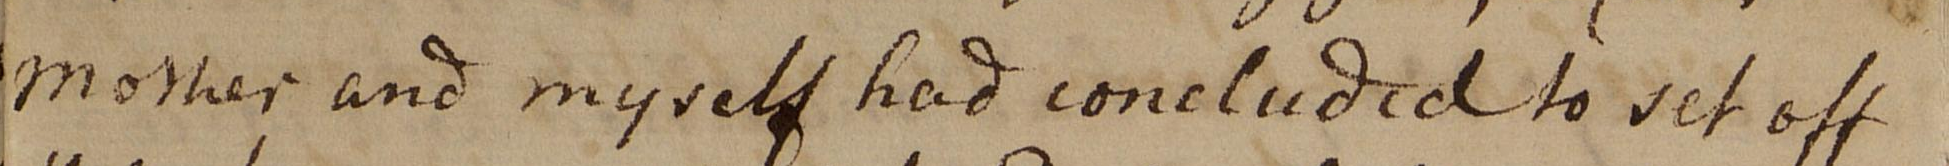mother and myself had concluded to set off
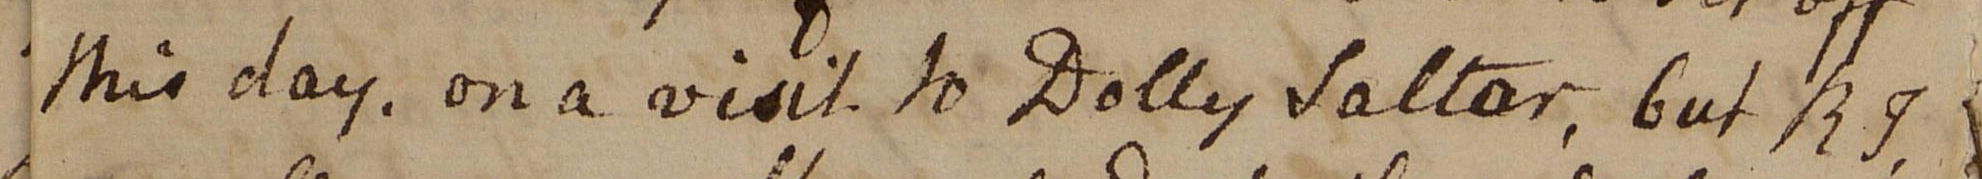this day on a visit to Dolly Saltar, but RJ
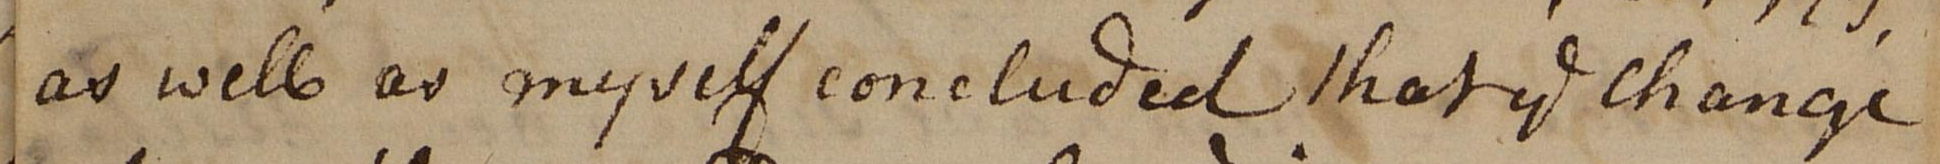as well as myself concluded that y^e Change
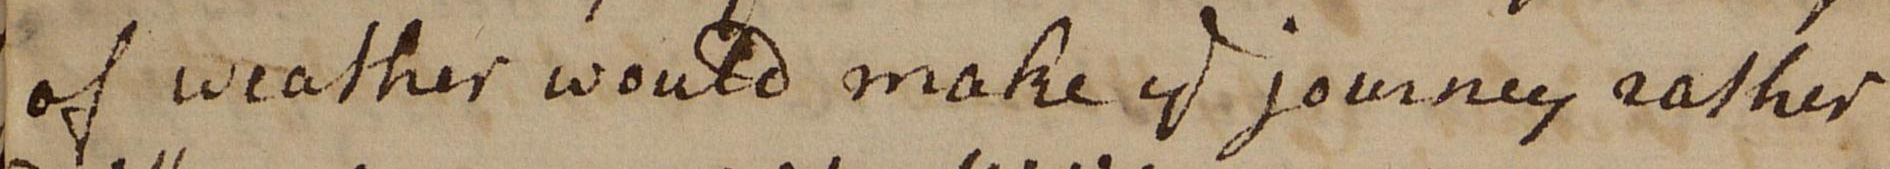of weather would make y^e journey rather
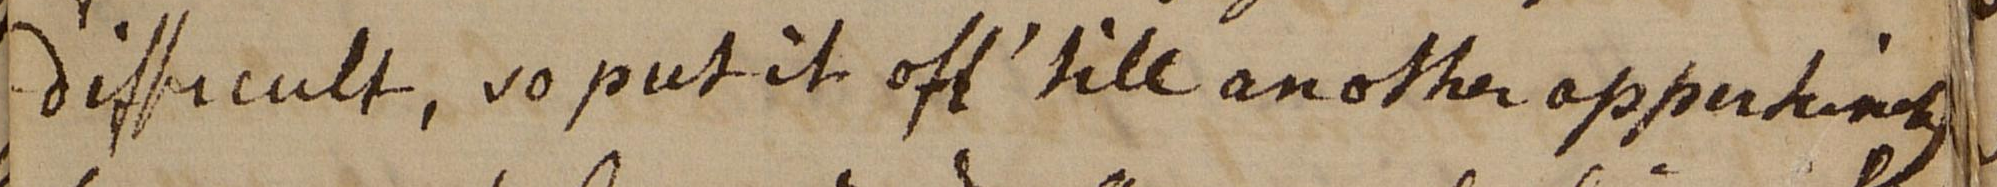difficult, so put it off 'till another oppurtunity
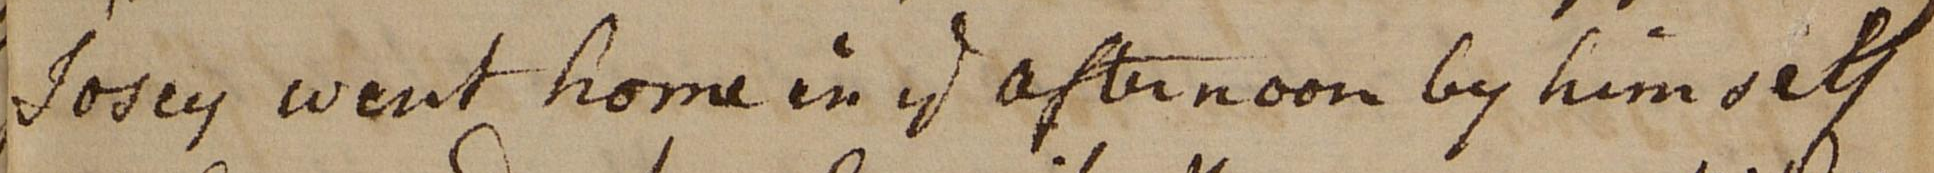Josey went home in y^e afternoon by himself
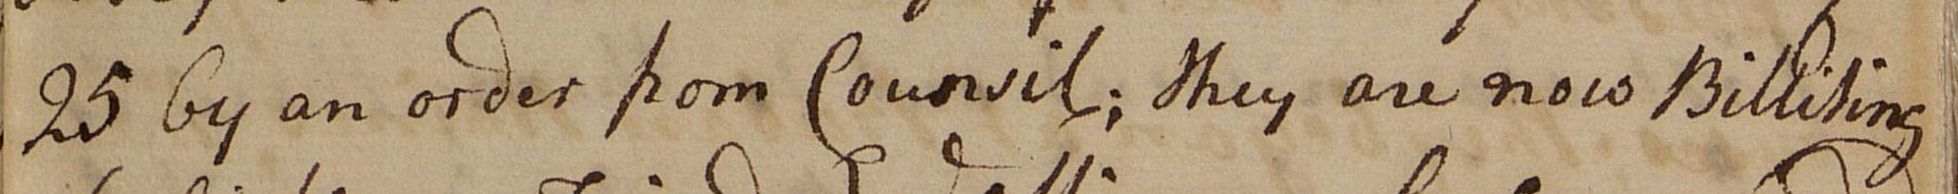25 by an order from Counsil; they are now Billiting
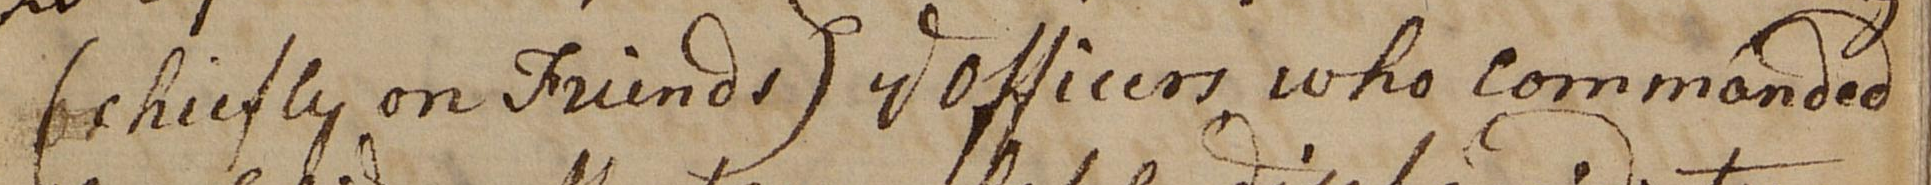(chiefly on Friends) y^e Officers who commanded
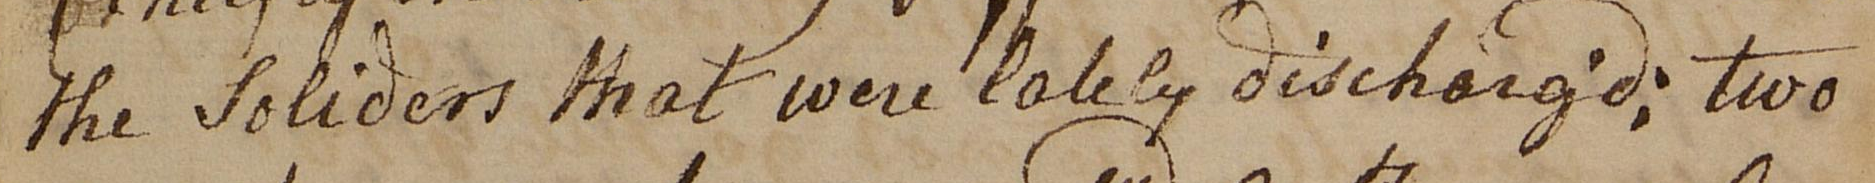the Soliders that were lately discharg'd; two
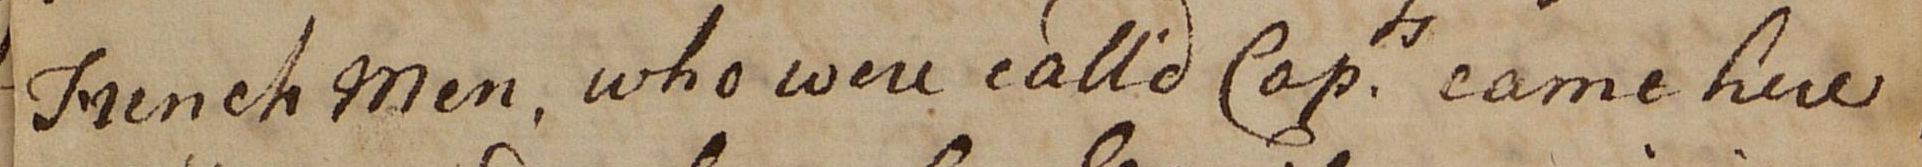French Men, who were call'd Cap^ts. came here
